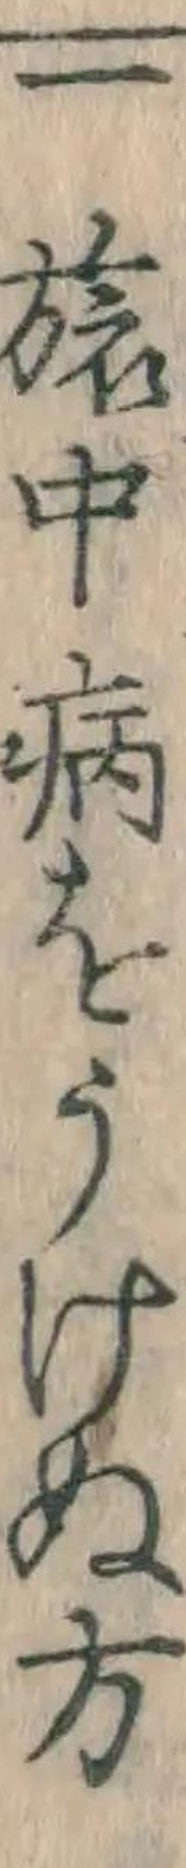一旅中病をうけぬ方
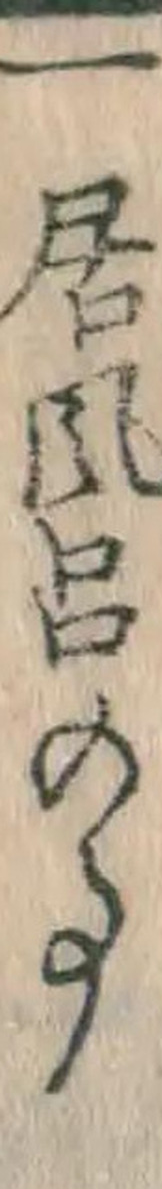一居風呂の事
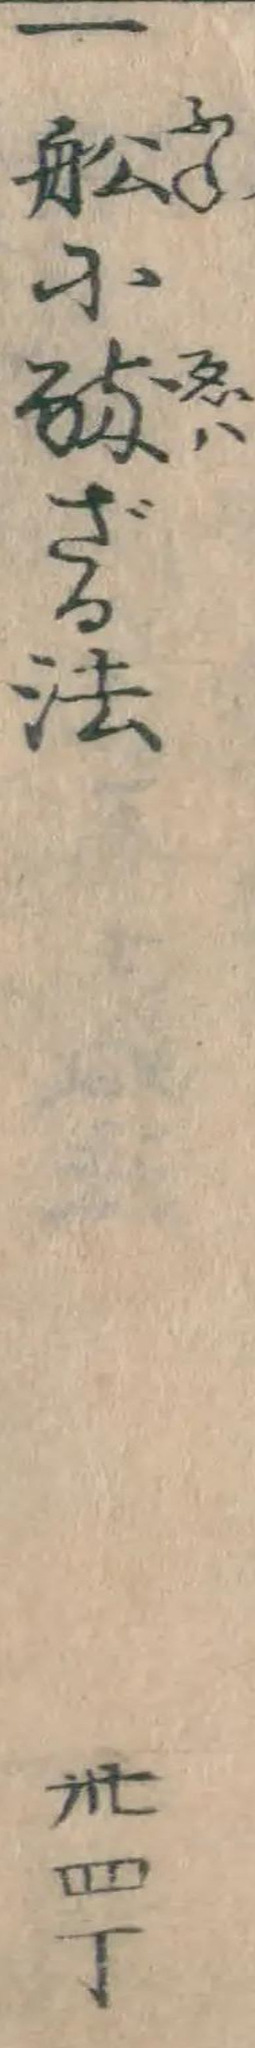一船に酔ざる法卅四丁

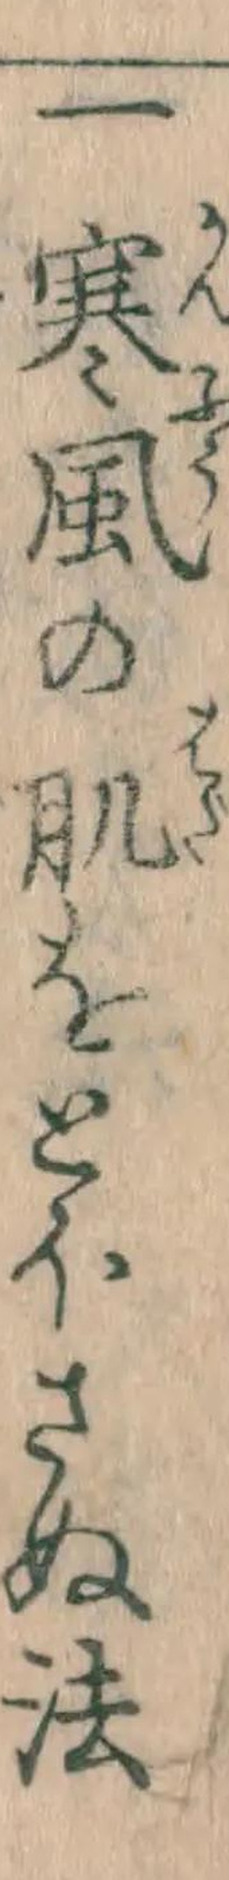一寒風の肌をとほさぬ法
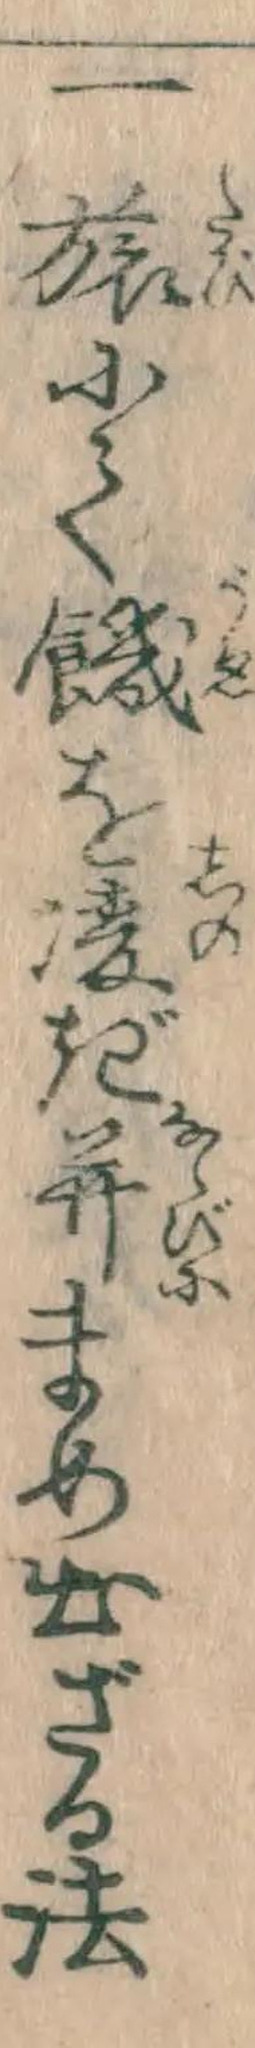一旅にて饑を凌ぎ并まめ出ざる法
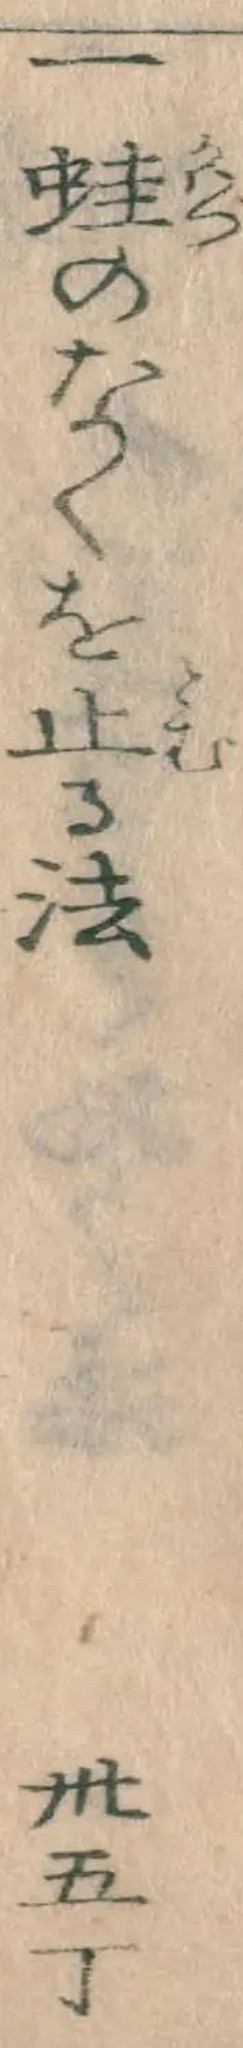一蛙のなくを止る法卅五丁
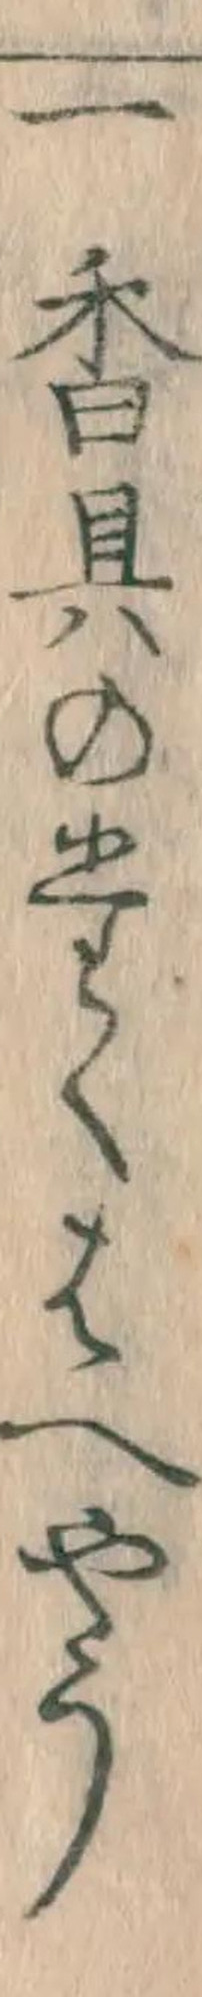一香具のたくはへやう
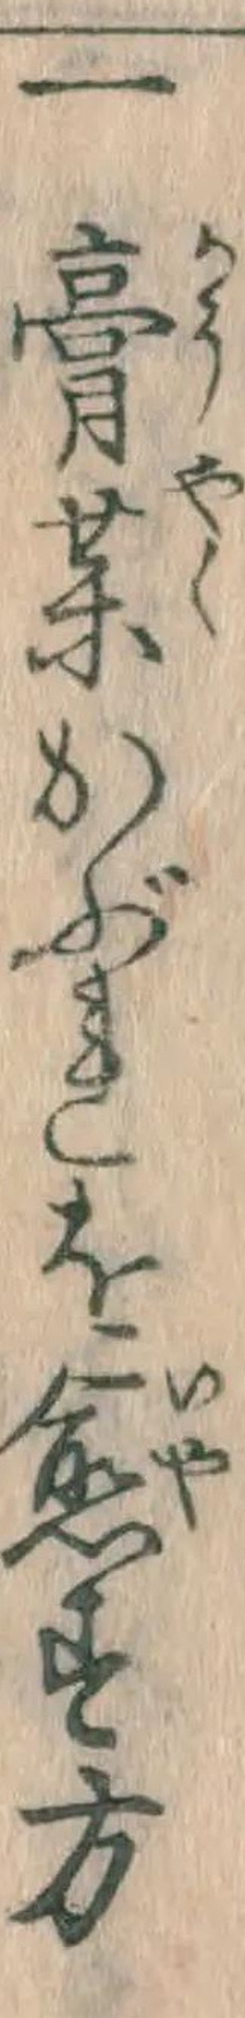一膏薬かぶれを愈す方
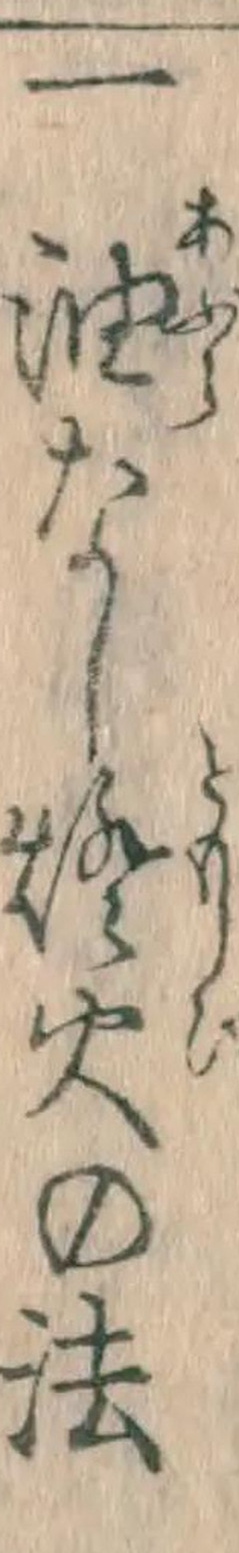一油なし燈火の法
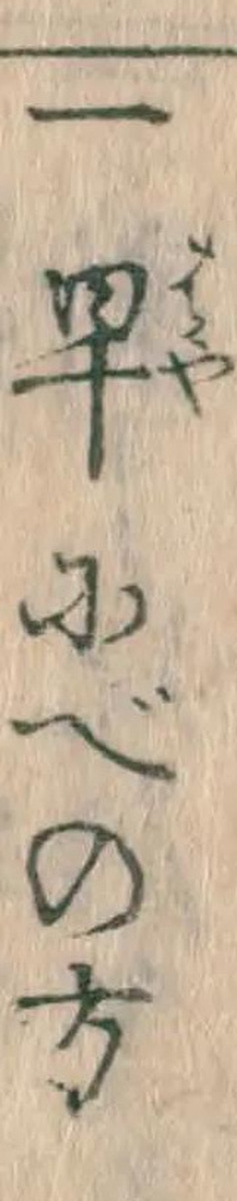一早にべの方
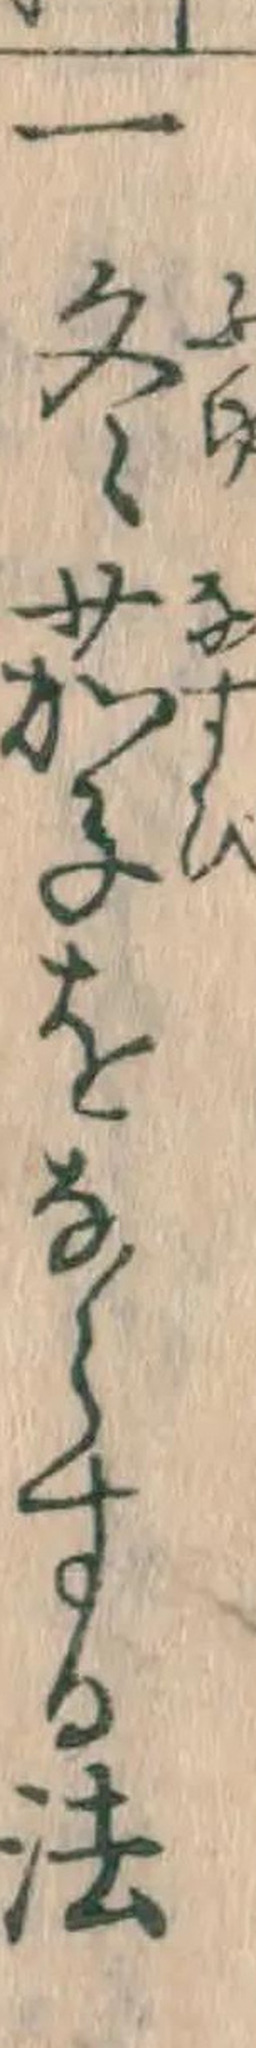一冬茄子をならする法
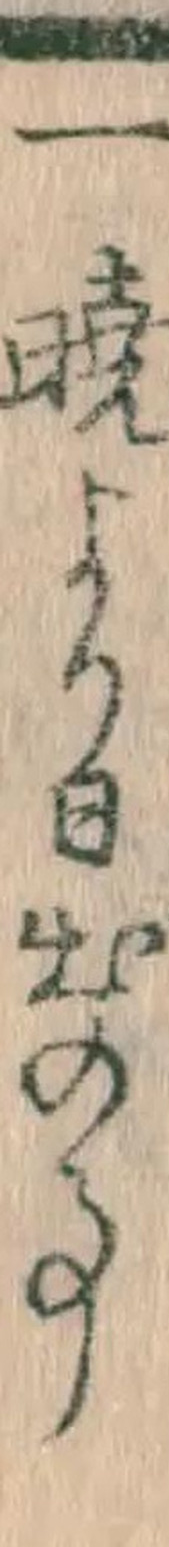一暁より日出の事
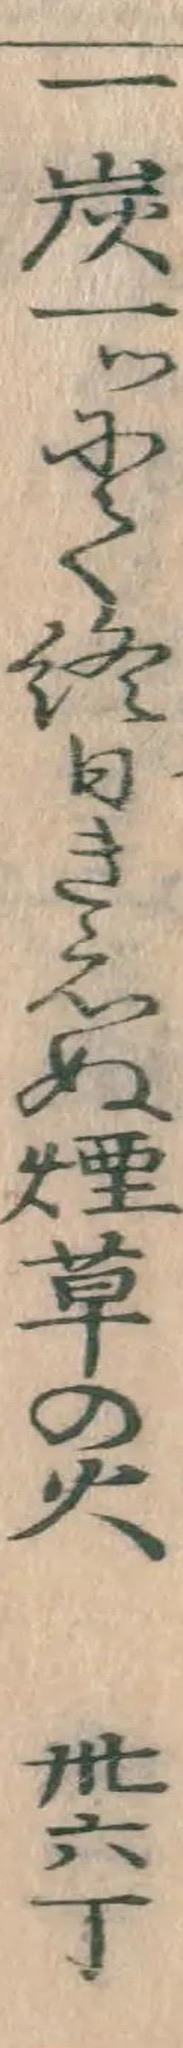一炭一ッにて終日きえぬ煙草の火卅六丁
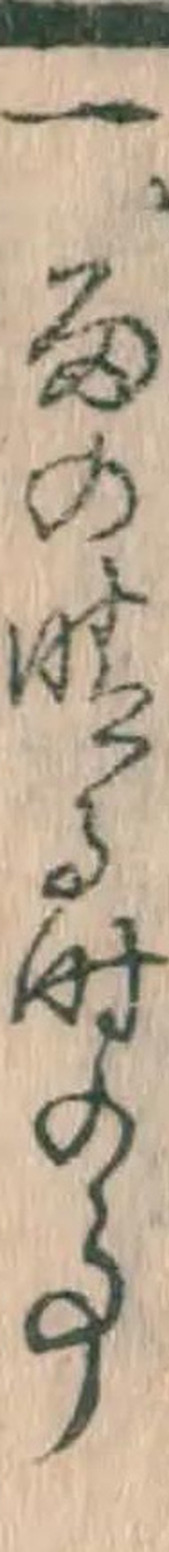一雨の晴る時の事
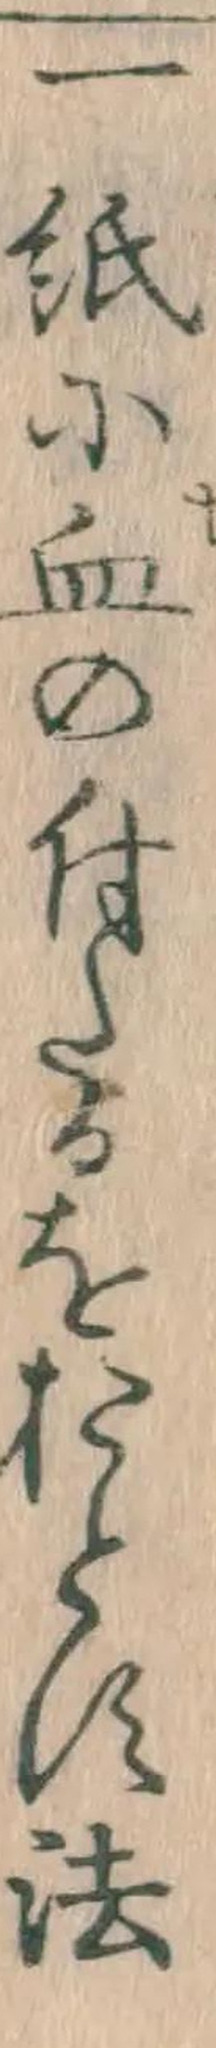一紙に血の付たるをおとす法
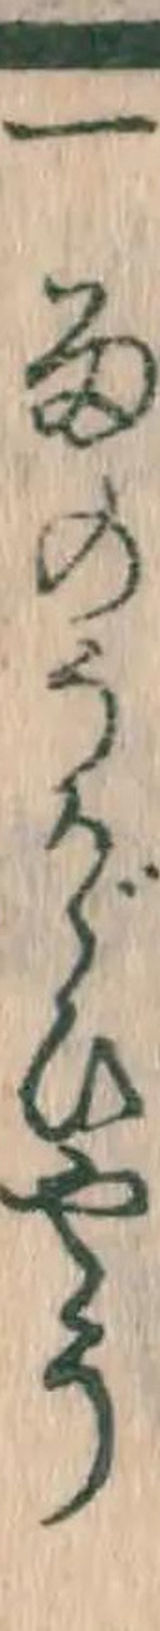一雨のうかゞひやう
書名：広益秘事大全 3巻. [1]
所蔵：国立国会図書館 National Diet Library, JAPAN
